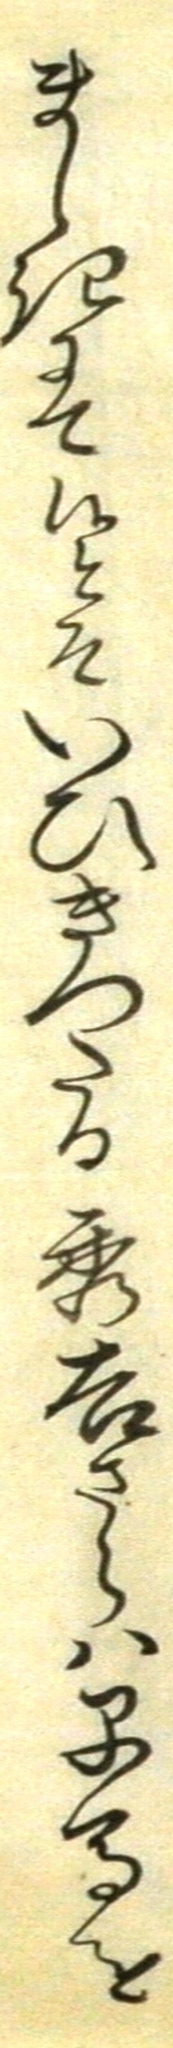ましきにて候とそいひきつたる秀吉さらは早馬を
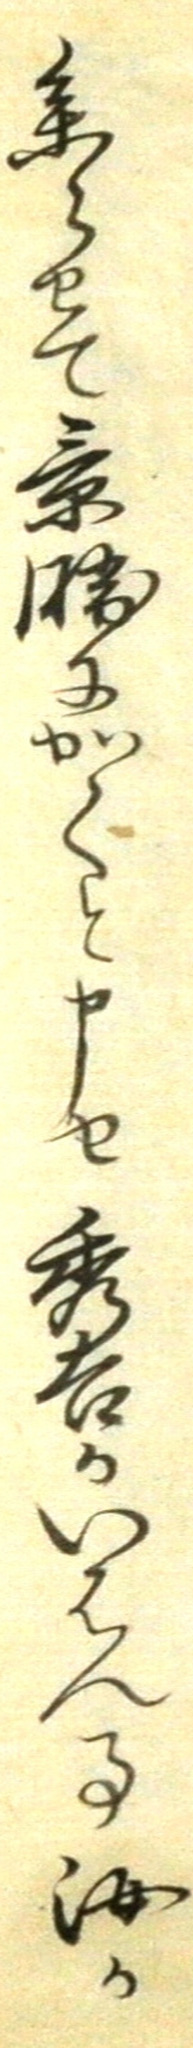参らせて景勝にかくと申せ秀吉かいはん事汝か
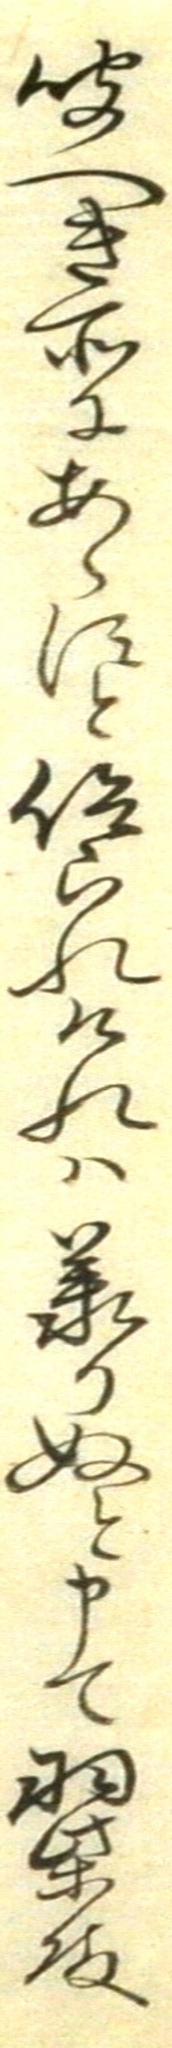聞へき所にあらすと仰られけれは承りぬと申て羽柴殿
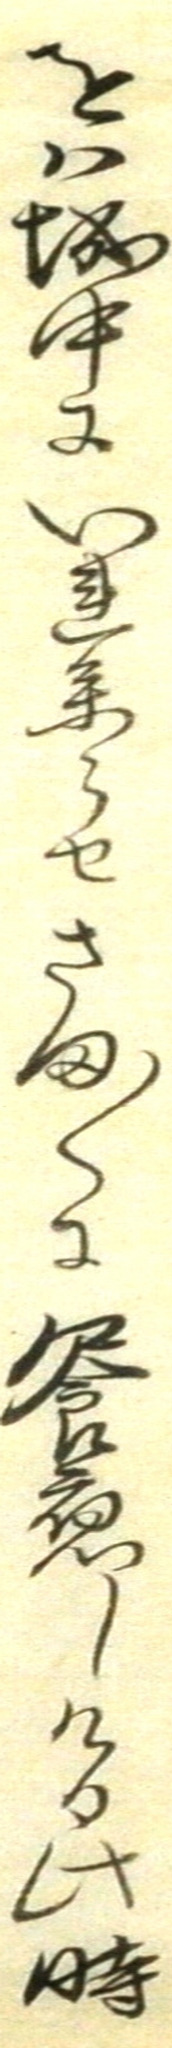をは城中にいれ参らせさま〳〵に饗応しける此時
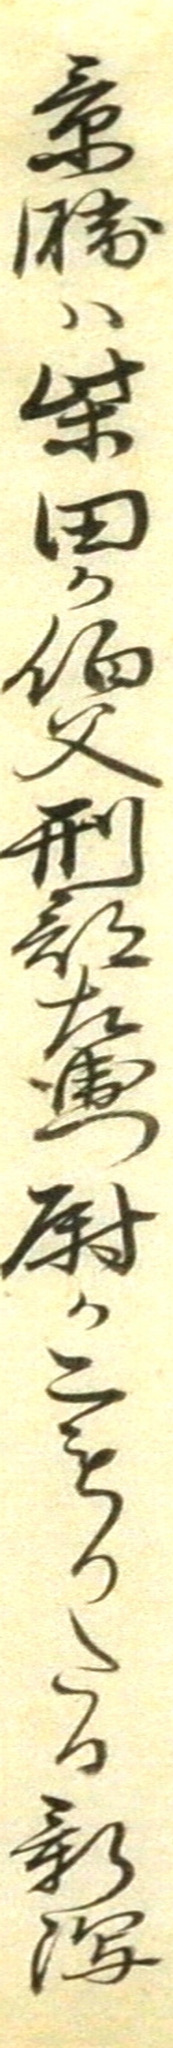景勝は柴田か伯父刑部左衛門尉かこもりたる新潟
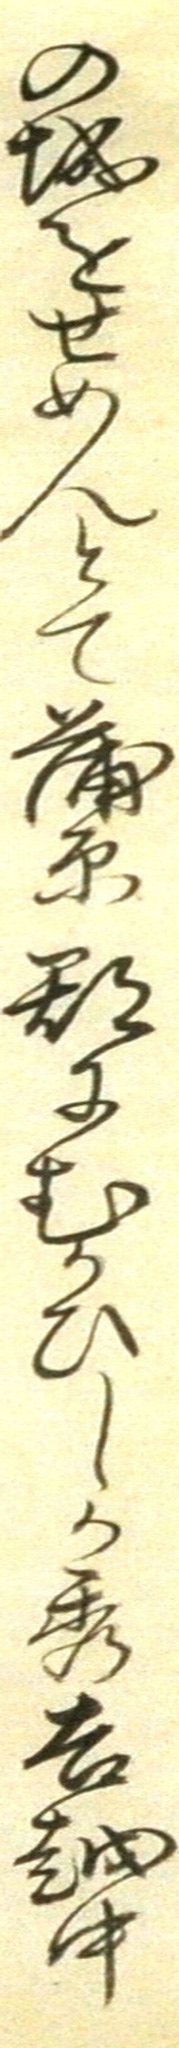の城をせめんとて蒲原郡にむかひしか秀吉越中
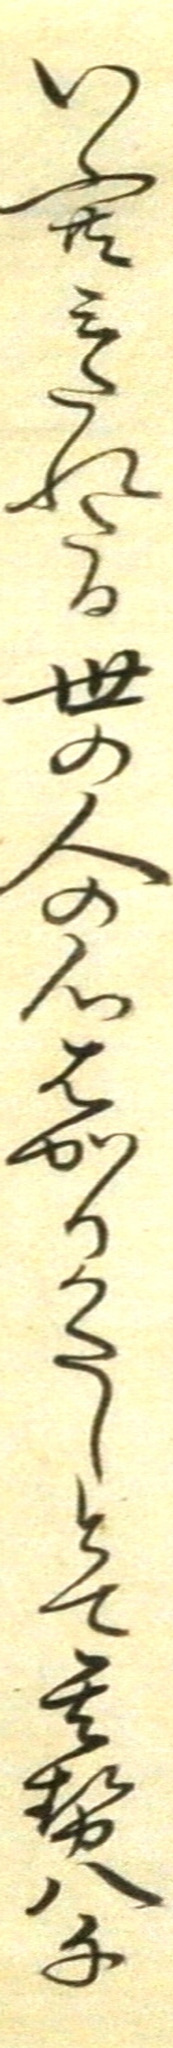いふ共みたれたる世の人の心はかりかたしとて其勢八千
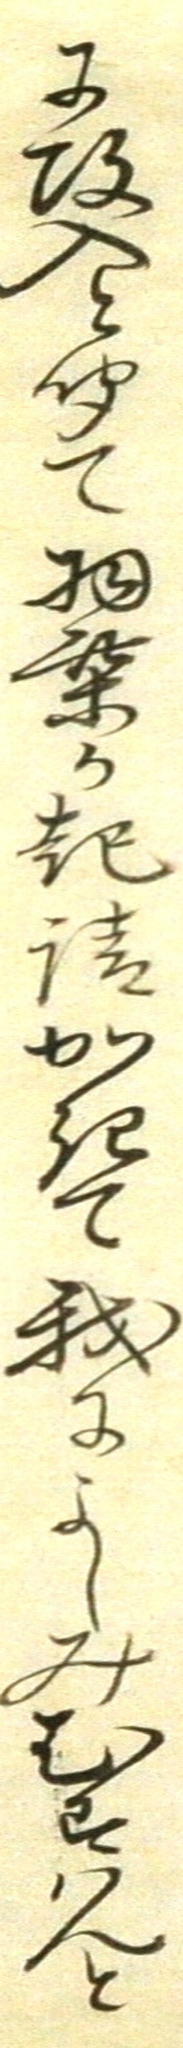に攻入と聞て羽柴か起請かきて我によしみむすはんと
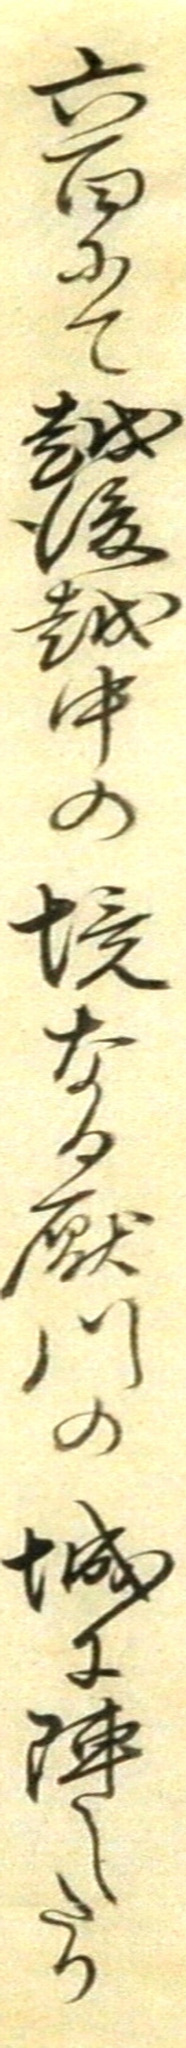六百にて越後越中の境なる厭川の城に陣したり
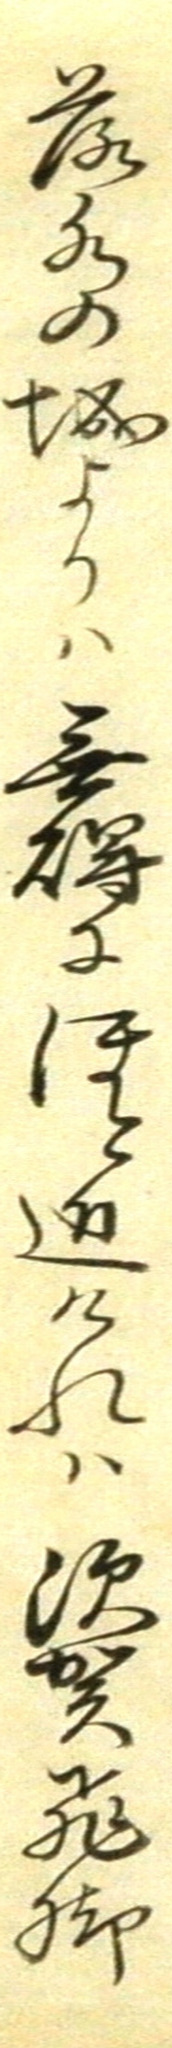落水の城よりは無碍にほと近けれは須賀飛脚
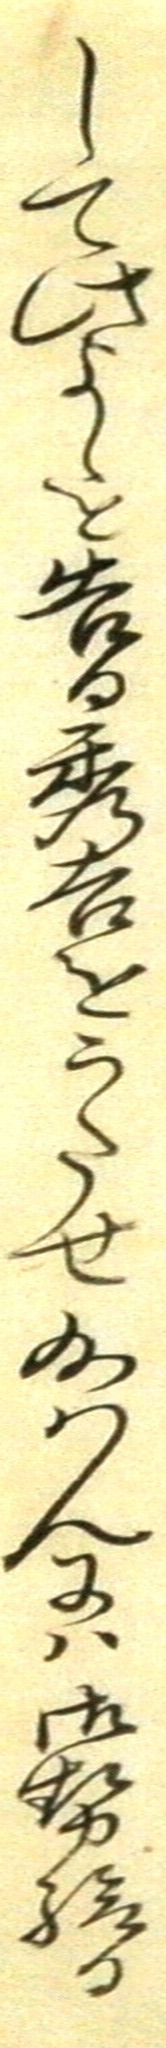して此よしを告る秀吉をうたせ給はんには御勢給る
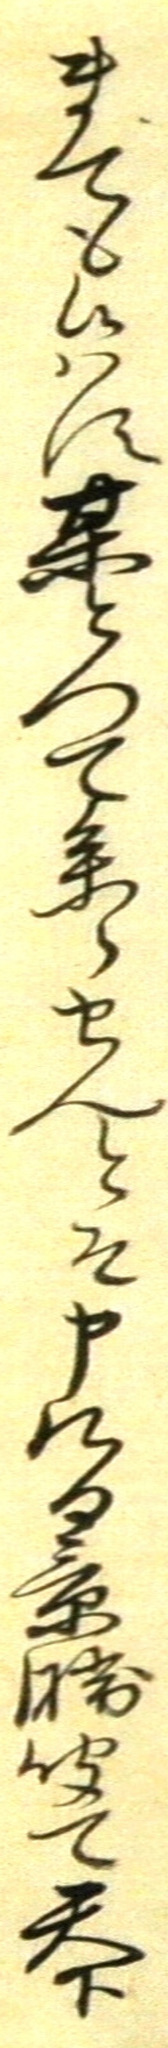まても候はす某とつて参らせんとそ申ける景勝聞て天下

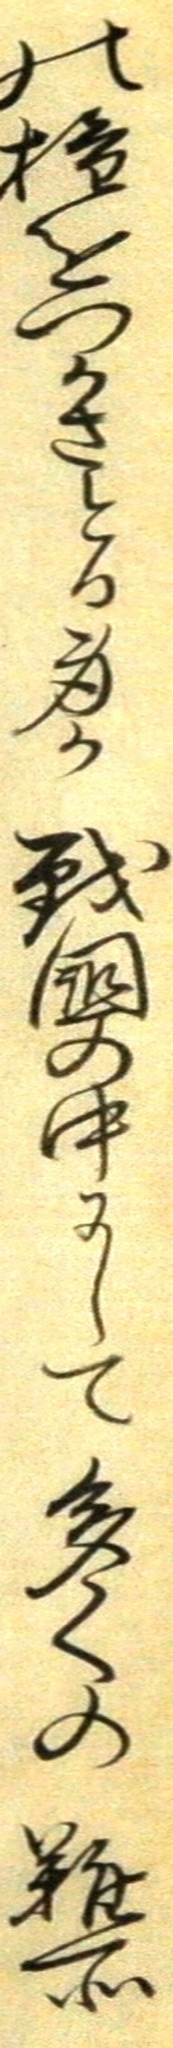の権をつかさとる身か戦国の中にして多くの難所
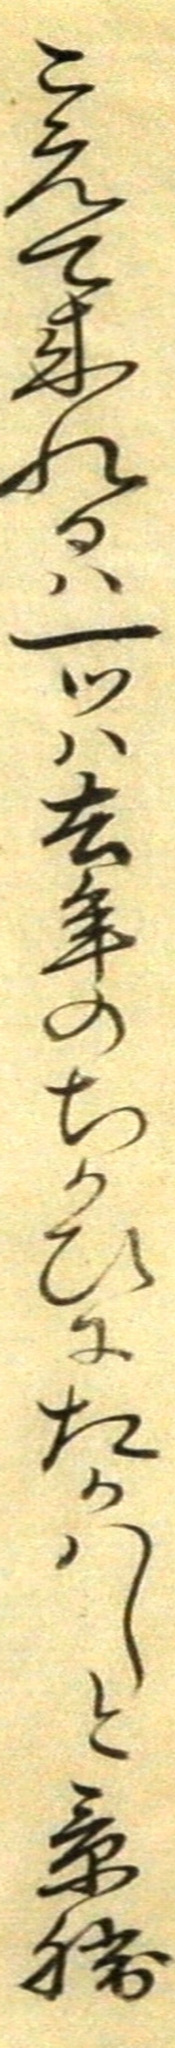こえて来れるは一ツは去年のちかひにたかはしと景勝
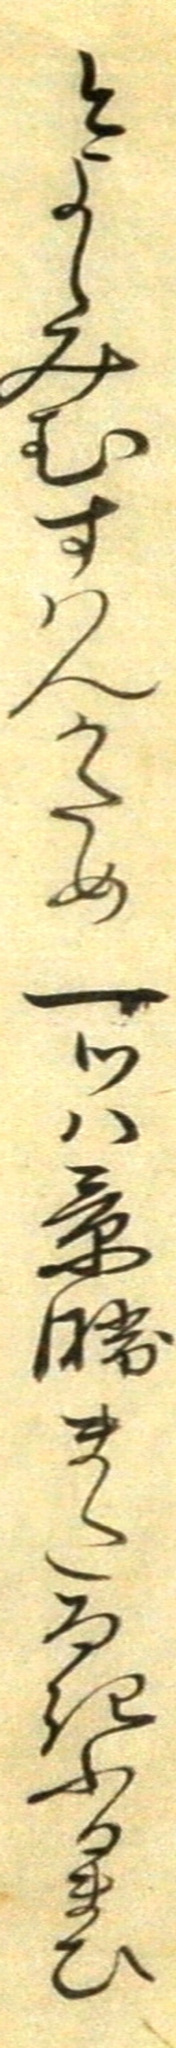とよしみむすはんかため一ツは景勝またるきふるまひ
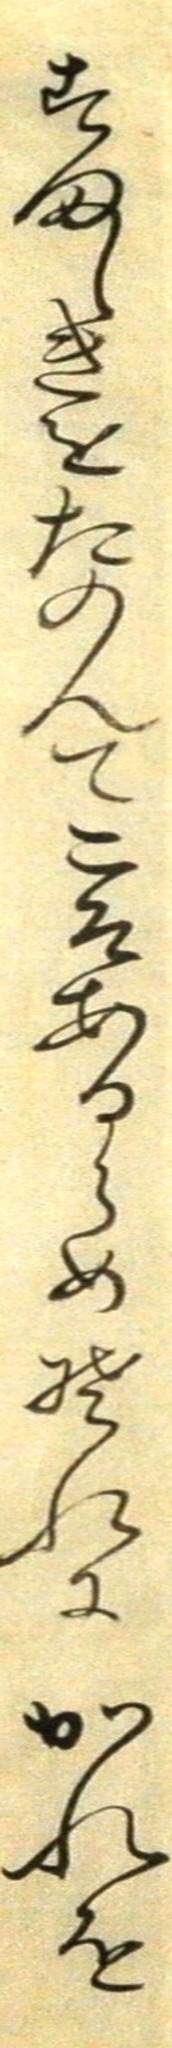すましきをたのんてこそあるらめそれにかれを
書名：藩翰譜（八・下）
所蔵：伊那市立高遠町図書館・合同会社AMANE
